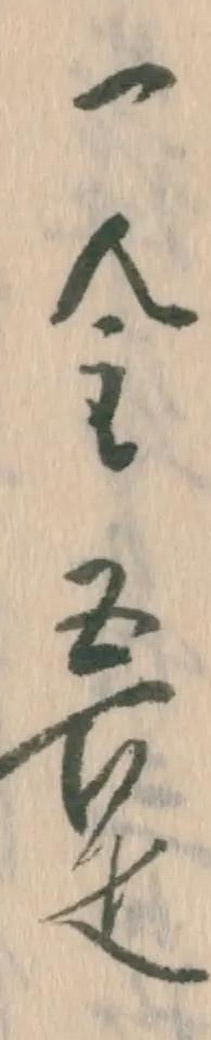一金五百疋
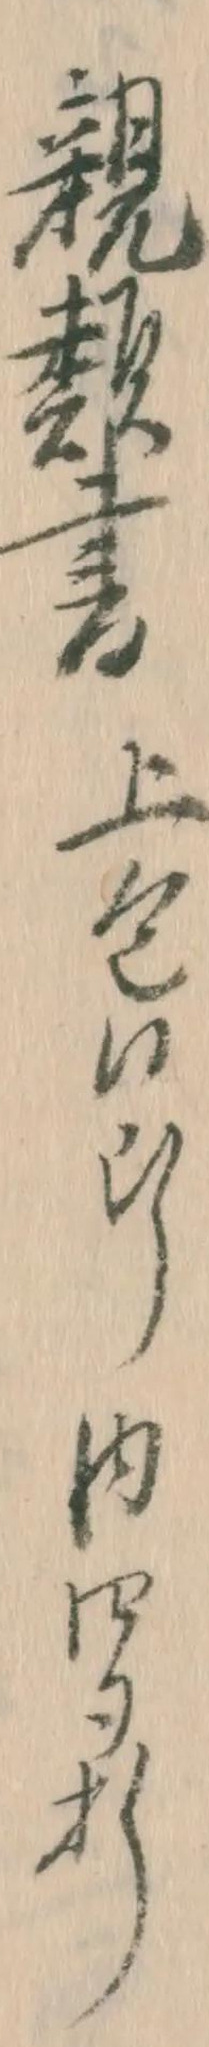親類書上包同断内四ツ折

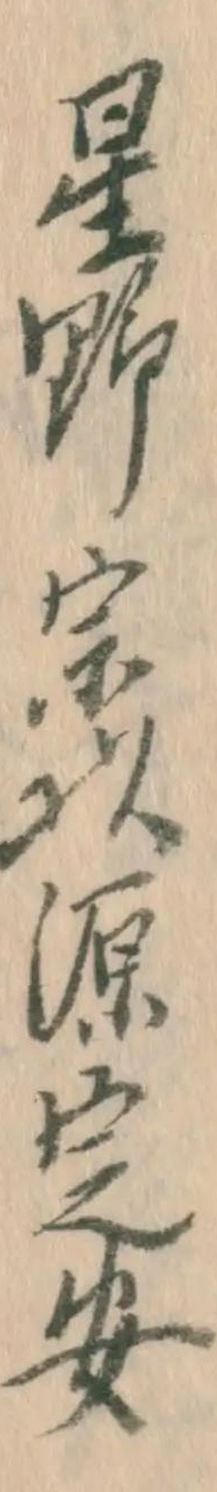星野宗以源定安
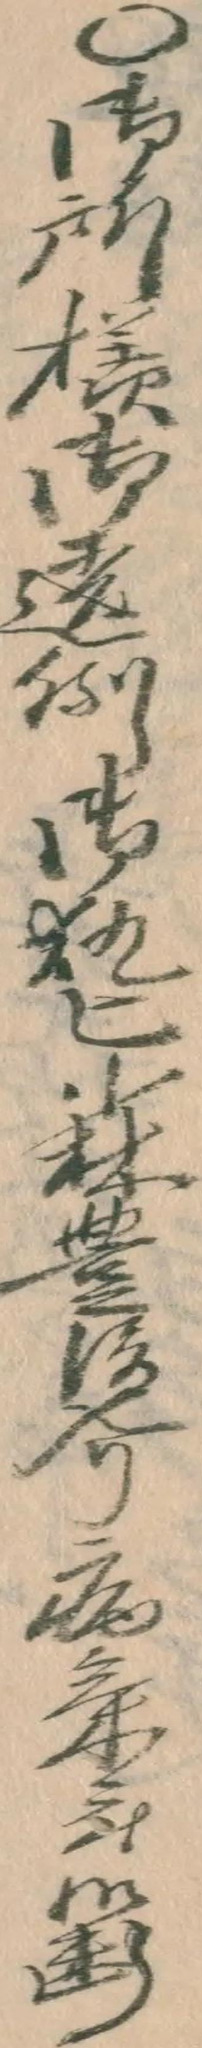○御所様御違例御執小林豊後介病氣ニ付御断
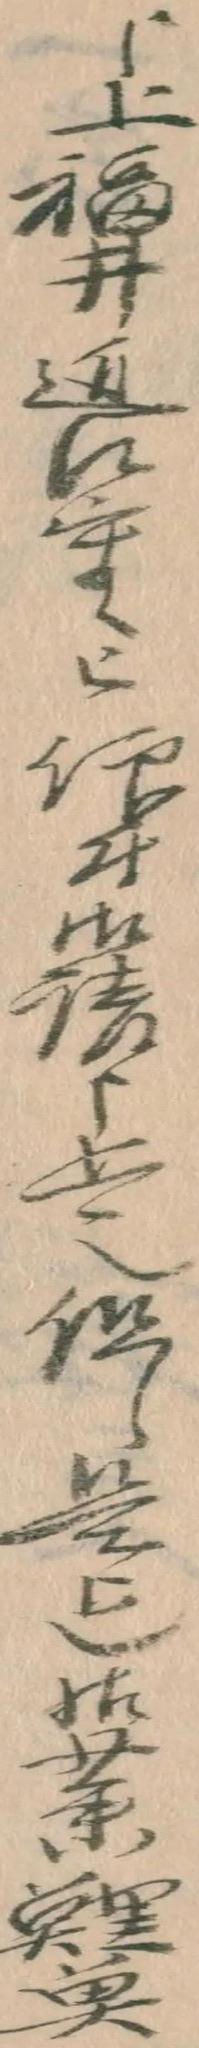申上福井近江守へ被仰付御請申上也但し是迄御薬鯉魚
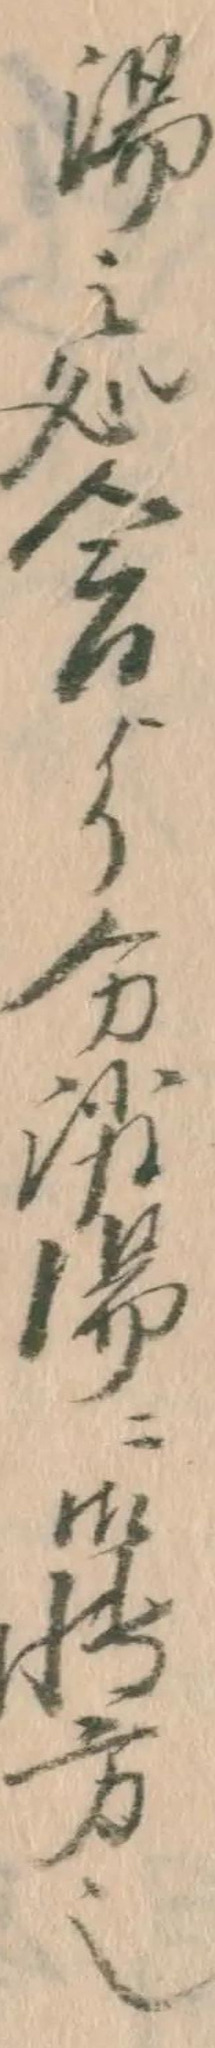湯之処会より分消湯に御轉方也
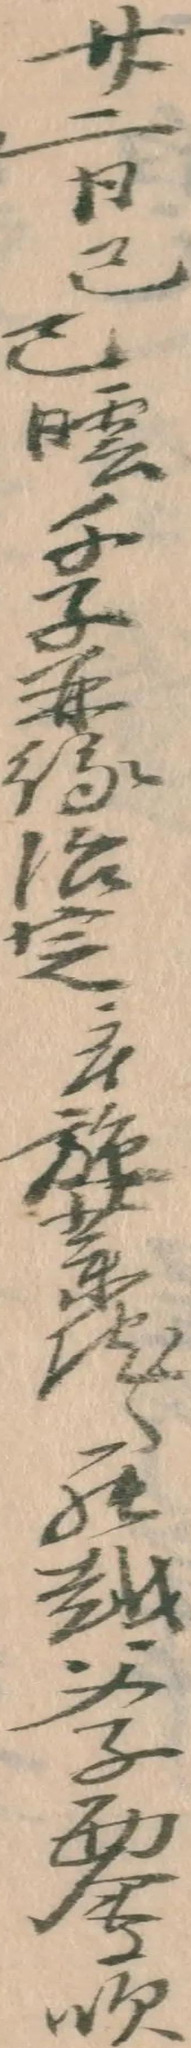廿二日己巳曇千子再縁治定ニ付施薬院へ罷越父子面會吹
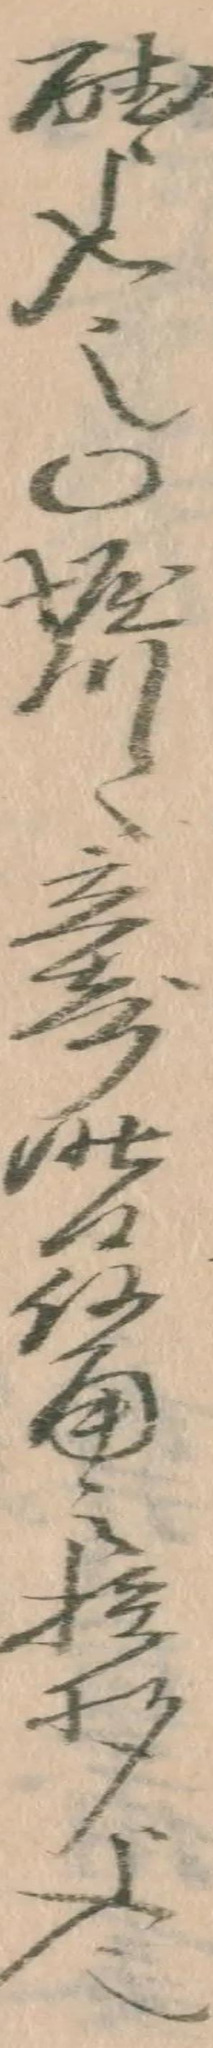聴申入之○堀川へ立寄昨日何角之挨拶申入也
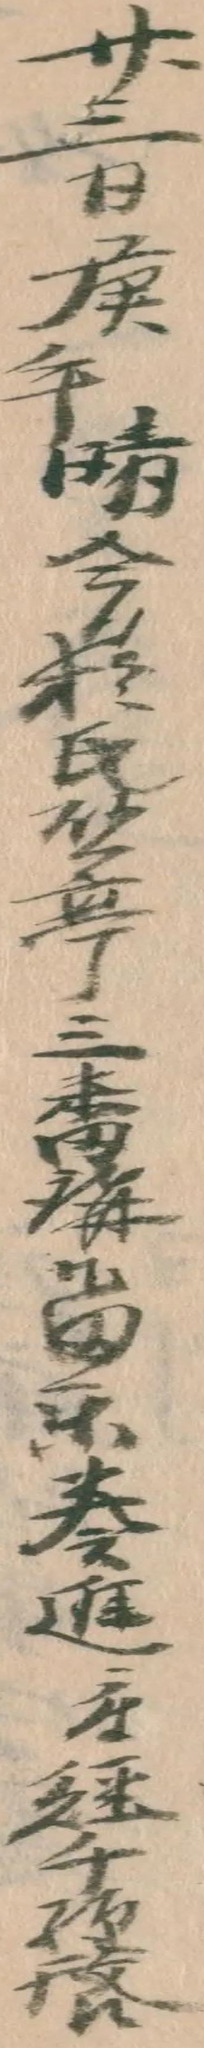廿三日庚午晴今日於氏哲亭三番構御田楽奏進ニ付経千経啓
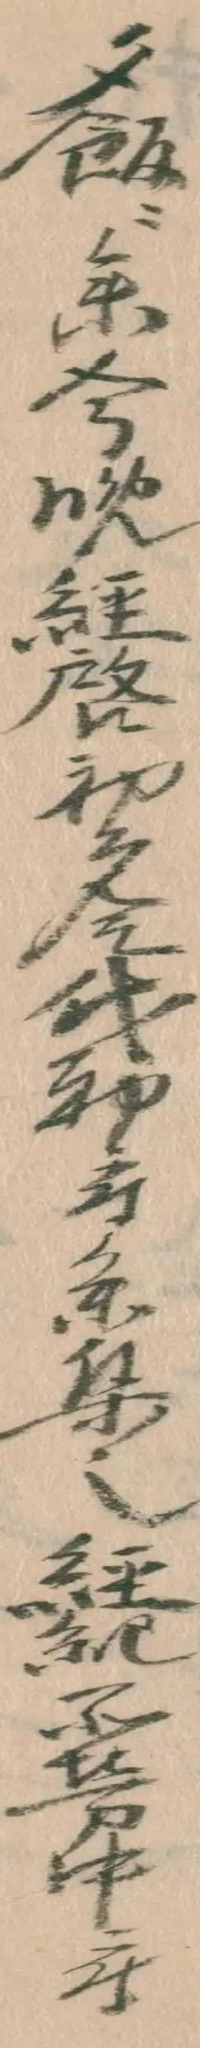夕飯ニ参今晩経啓初而令代勤ニ付参集也経紀所労中ニ付
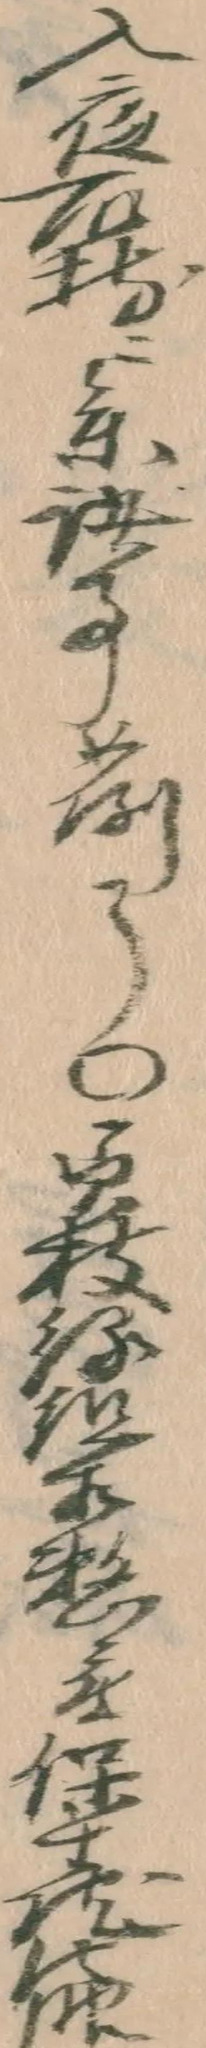入夜所持ニ参諸事如例了〇美枝縁組相整ニ付保生院代銀
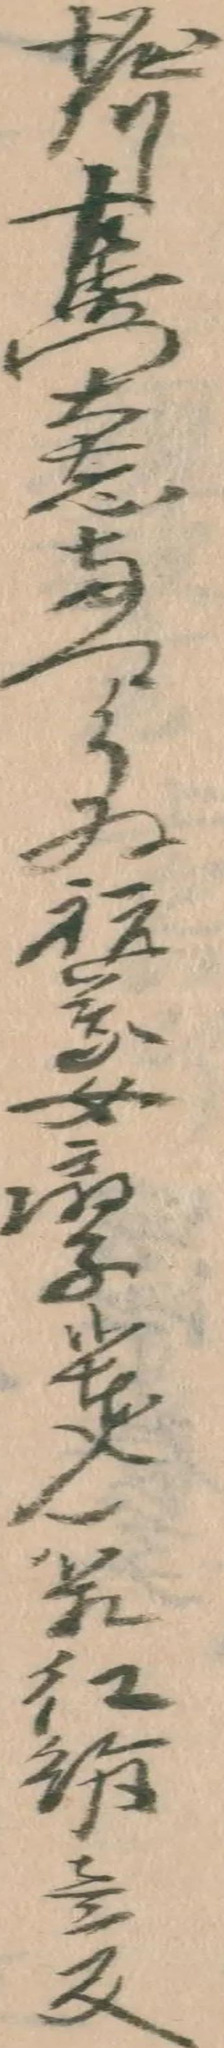堀川左衛門大志両人より為祝義女扇子弐本入箱紅絹壱反
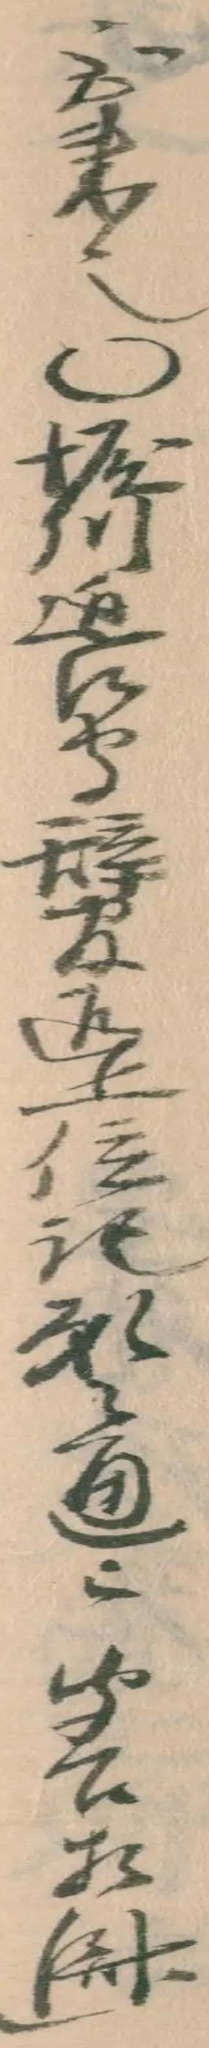到来也○堀川近江守辞官返上位記願之通被聞召相済也
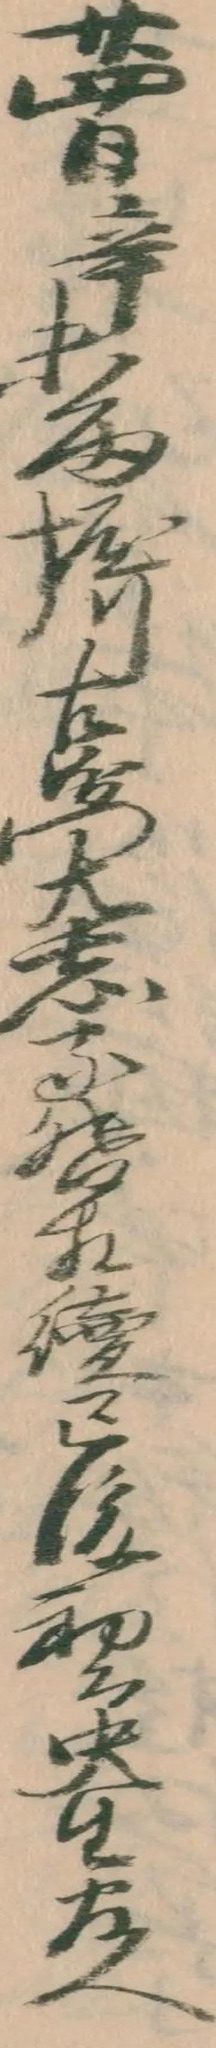廿四日辛未雨堀川左衛門大志家督相續已後初而史生官人
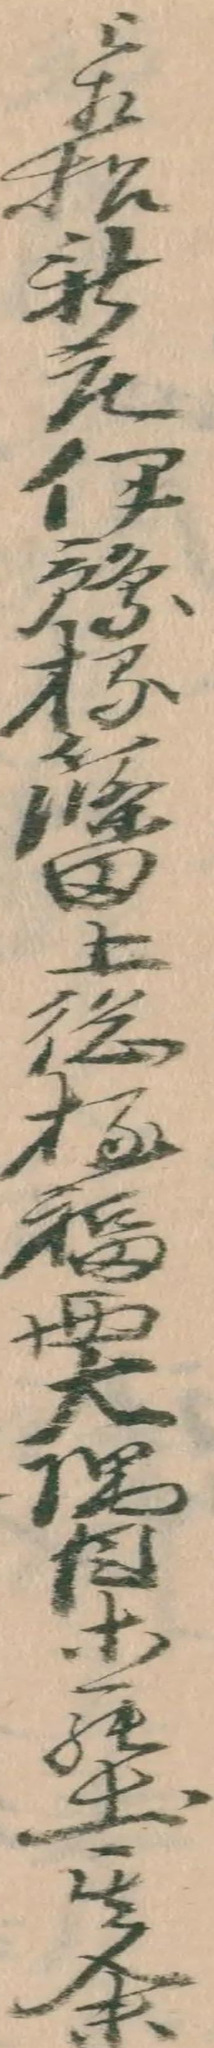被相招新庄伊豫掾篠田上総掾福西大隅目等罷出其余
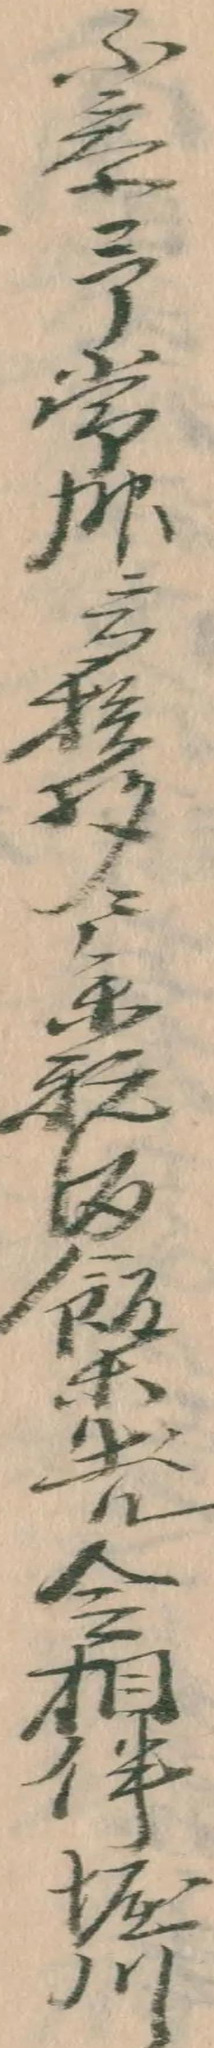不参予常服ニ而挨拶ニ参祝酒飯等出ル令相伴堀川
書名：賀茂社記録. 第67冊
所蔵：国立国会図書館 National Diet Library, JAPAN
